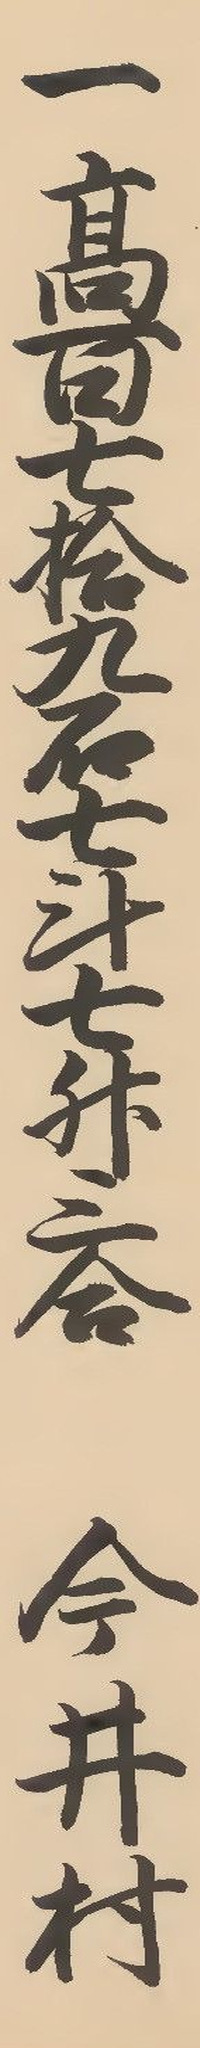一高百七拾九石七斗七升三合今井村
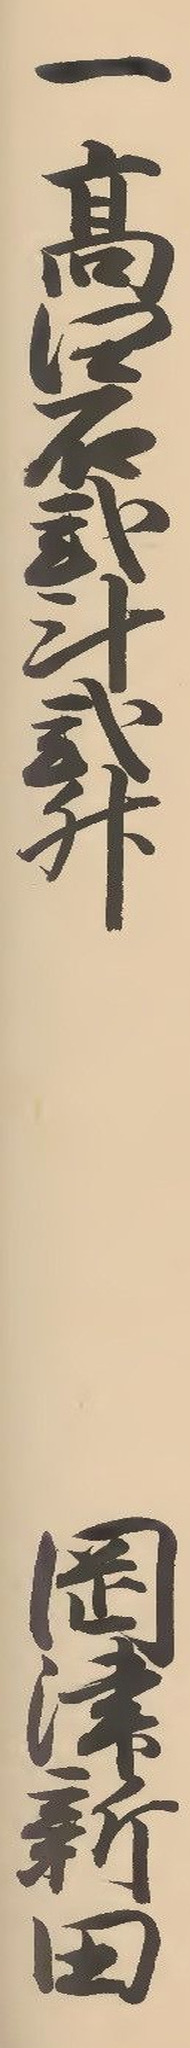一高四石弐斗弐升岡津新田
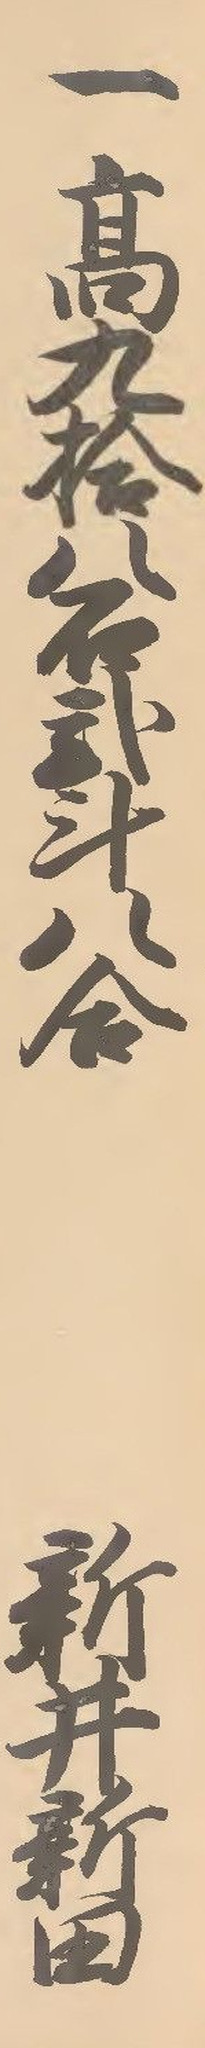一高九拾八石弐斗八合新井新田
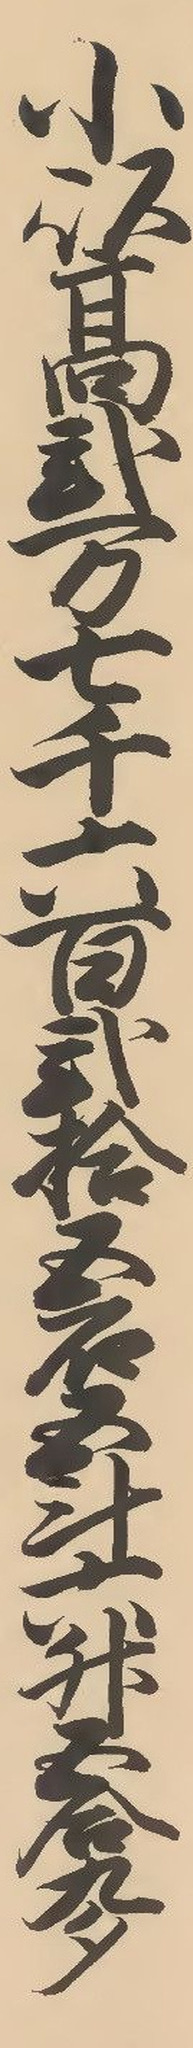小以高弐万七千六百弐拾五石五斗六升五合九勺

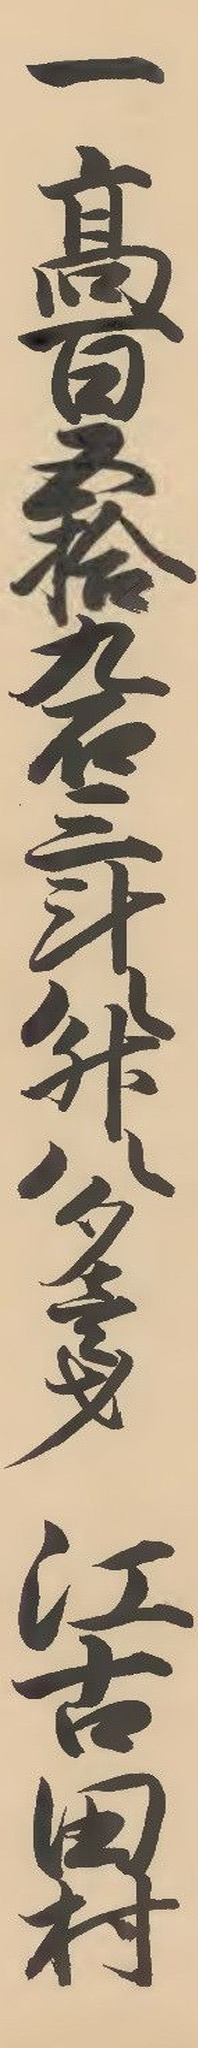一高百五拾九石三斗八升八勺壱才江古田村
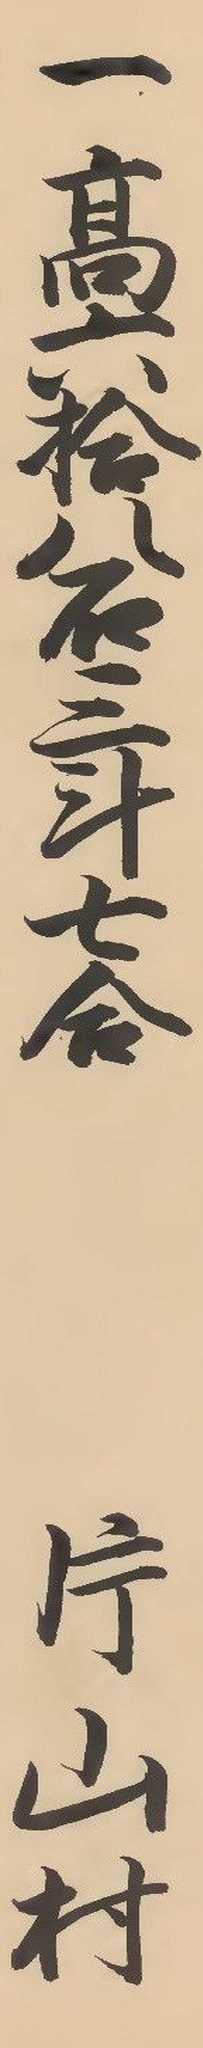一高六拾八石三斗七合片山村
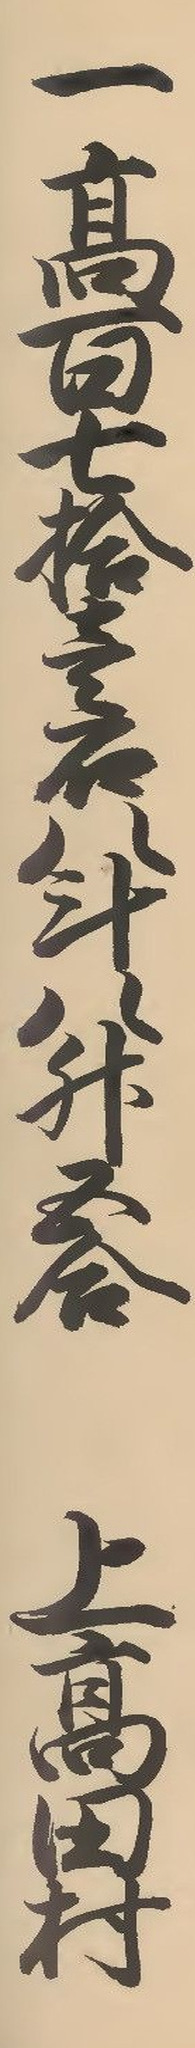一高百七拾壱石八斗八升五合上高田村
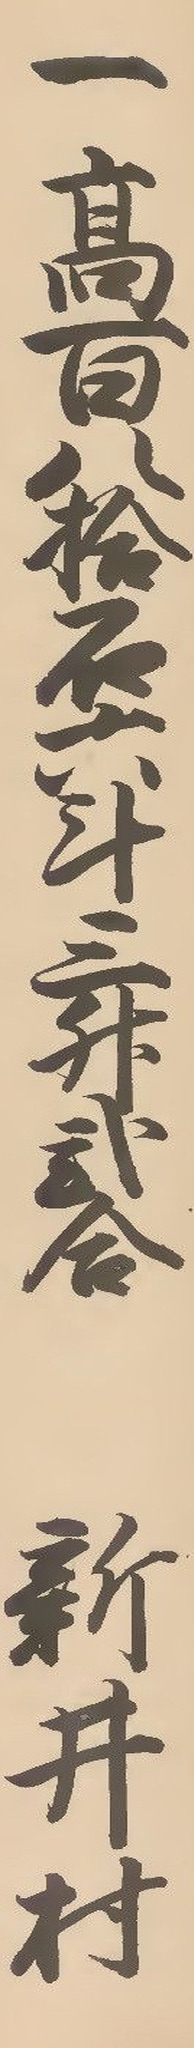一高百八拾石六斗三升弐合新井村
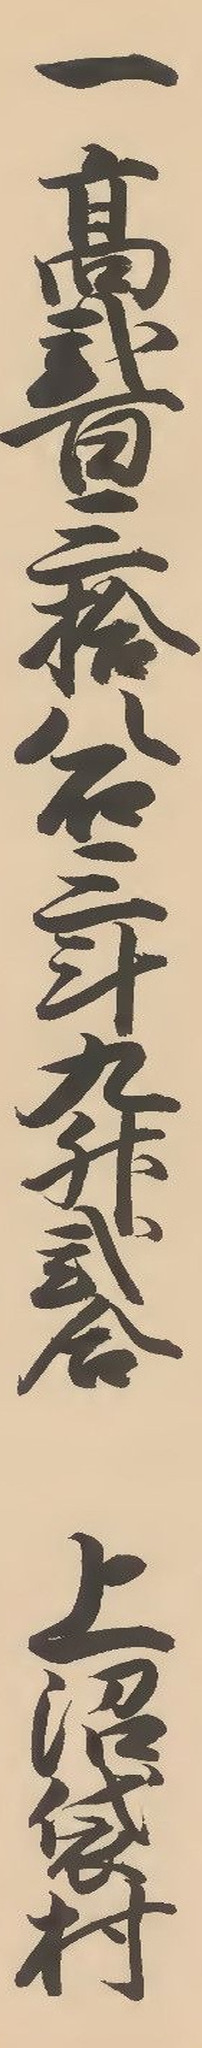一高弐百三拾八石三斗九升弐合上沼袋村
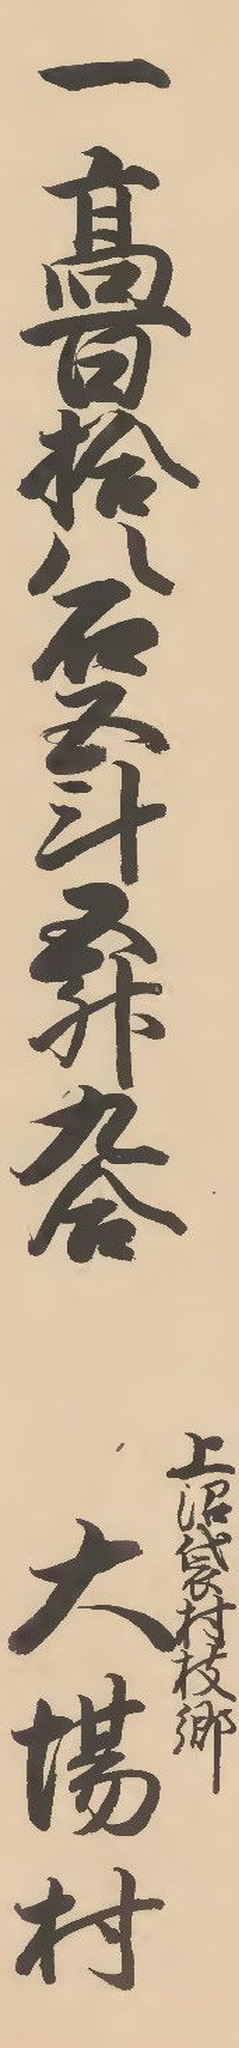一高百拾八石五斗五升九合大場村
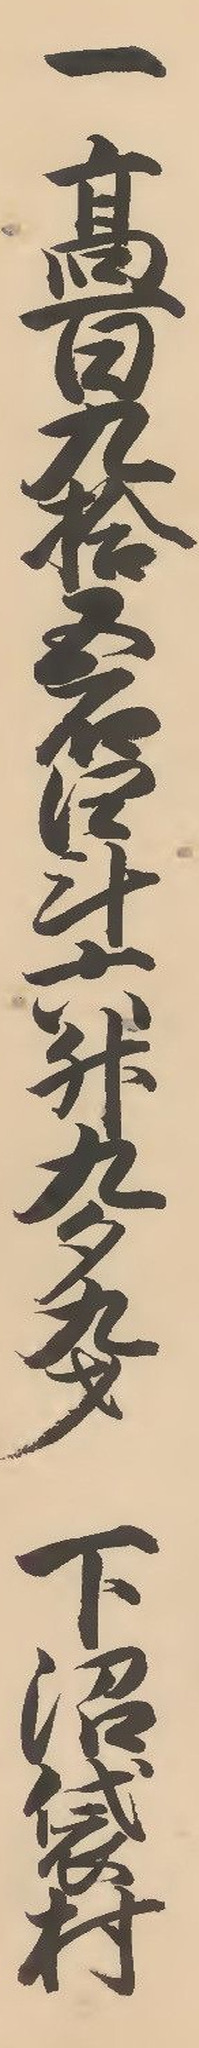一高百九拾五石四斗六升九勺九才下沼袋村

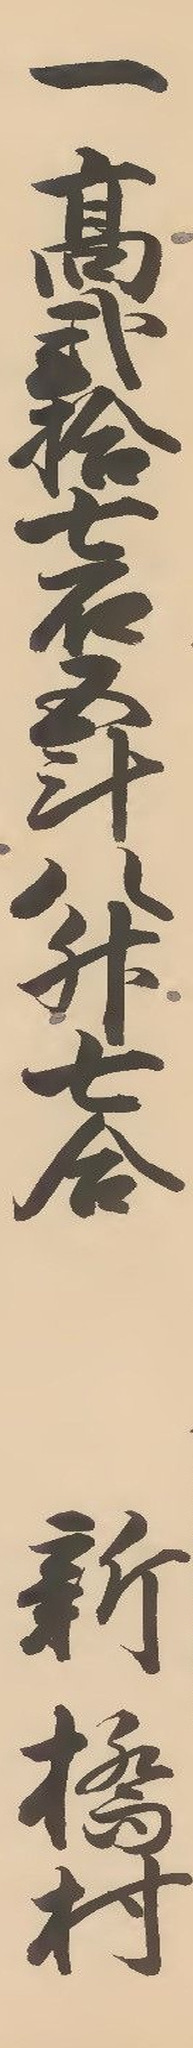一高弐拾七石五斗八升七合新橋村
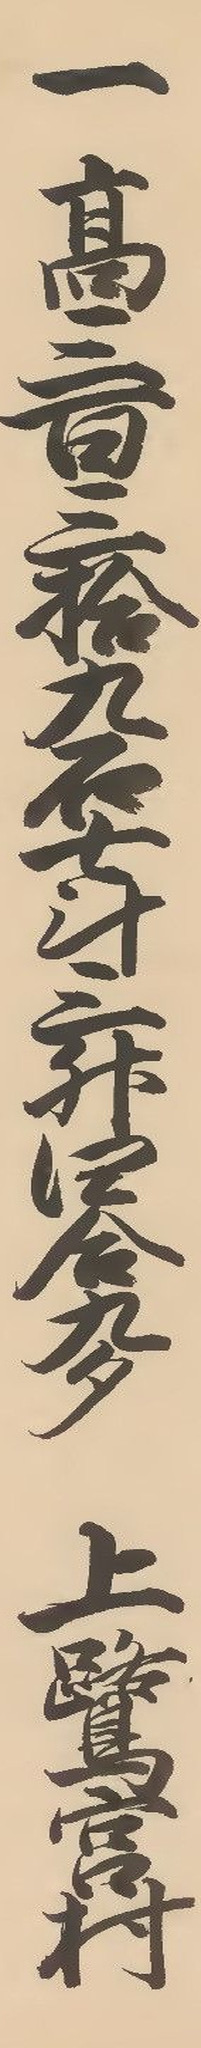一高三百三拾九石七斗三升四合九勺上鷺宮村
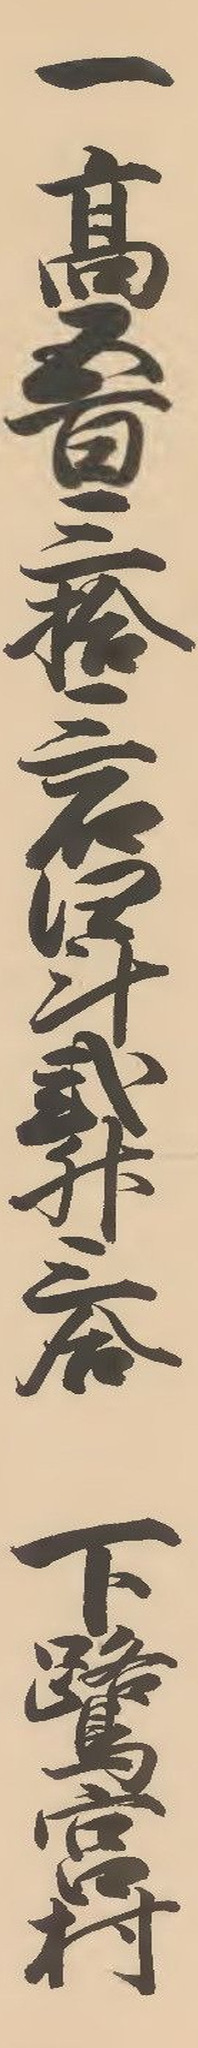一高五百三拾三石四斗弐升三合下鷺宮村
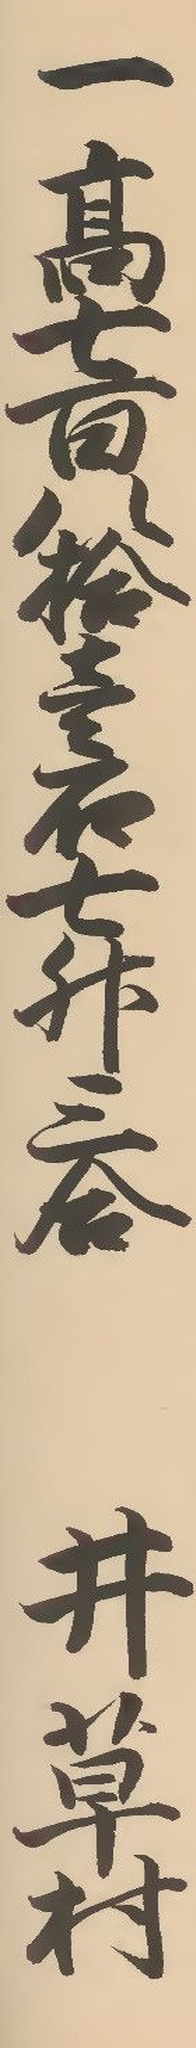一高七百八拾壱石七升三合井草村
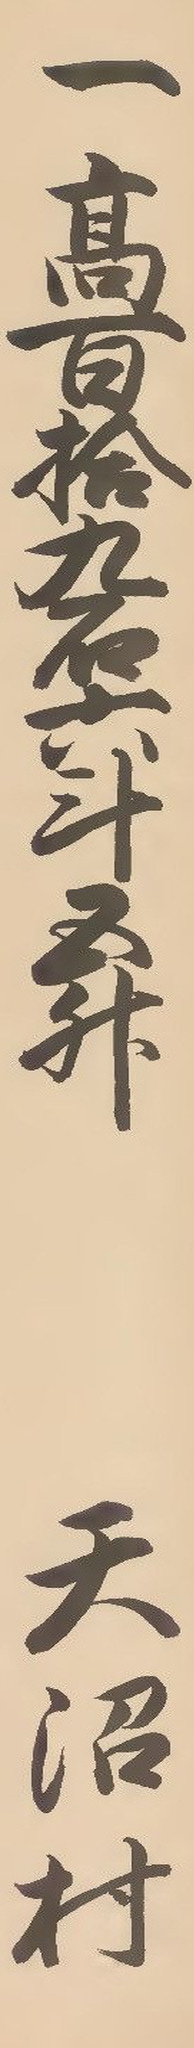一高百拾九石六斗五升天沼村
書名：武蔵国郷帳　上
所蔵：国立公文書館 National Archives of Japan
